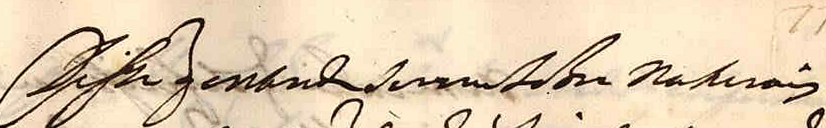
Disse q̄ entende serem sobrenaturais
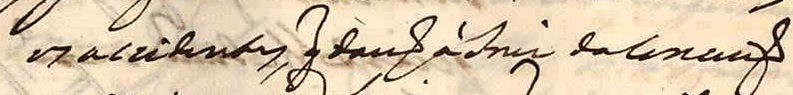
os accidentes, q̄ dauaõ à Ines da Conceiçaõ
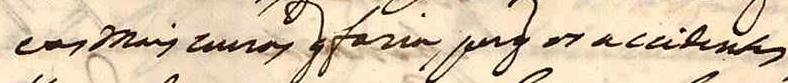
e as mais couzas q̄ fazia, porq̄ os accidentes
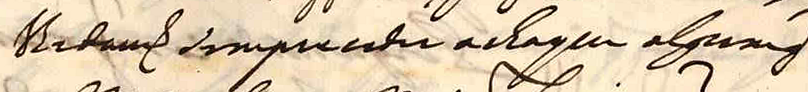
lhe dauaõ sem preceder achaque algum q̄
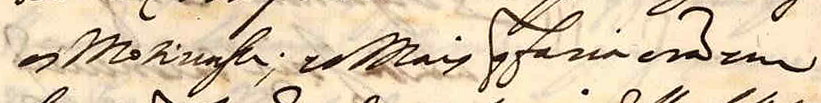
os motiuasse; e o mais q̄ fazia eraõ em
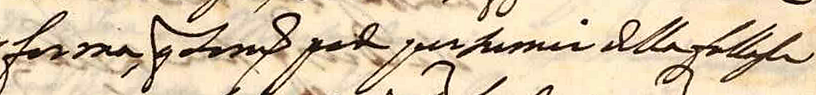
forma, q̄ senaõ pode persumir della fallasse
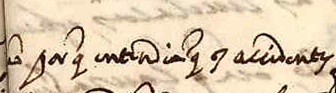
aõ porq̄ entendia q̄ os accidentes
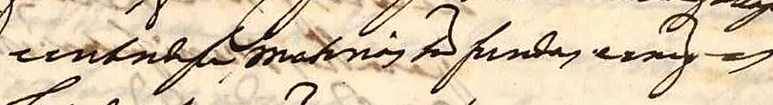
e entendesse materias taõ fundas, e em q̄ os
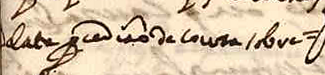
elata ꝓcediaõ de couza sobre
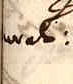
ural:
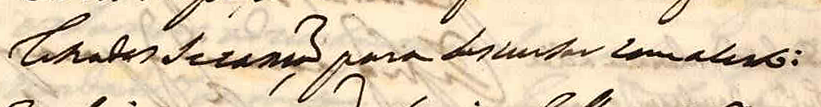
letrados se cançaõ para discursar com acerto:
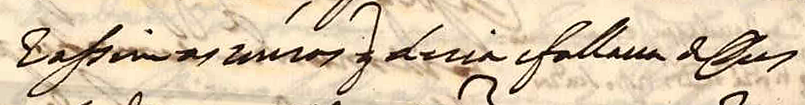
E assim as couzas q̄ dezia e fallaua de Deos
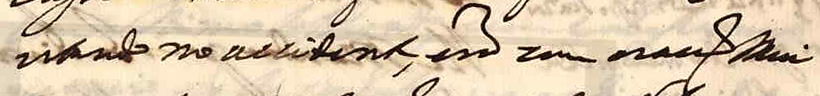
estando no accidente, eraõ com oraçaõ mui
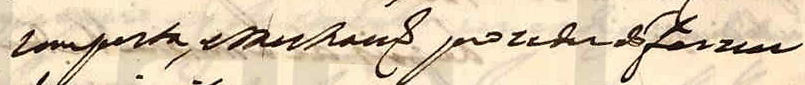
composta, e mostrauaõ proceder do feruor
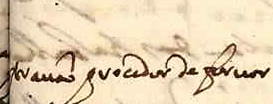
trauaõ proceder de feruor
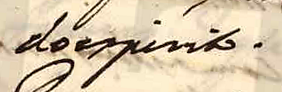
do espirito.
